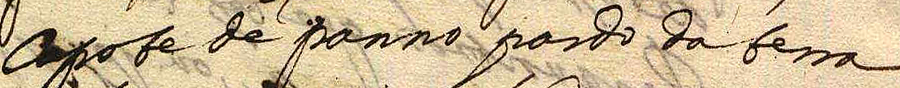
capote de panno pardo da terra,
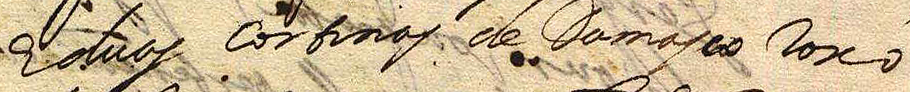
E duas cortinas de Damasco Roxo
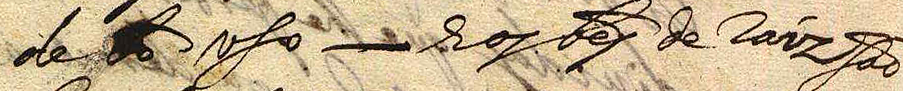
de _ vso - E os bēs de Raíz saõ
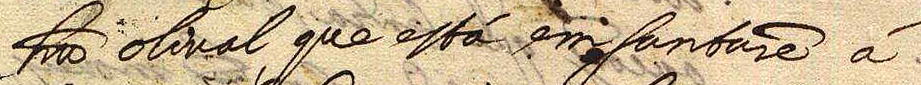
hū oliual, que está em santarē á
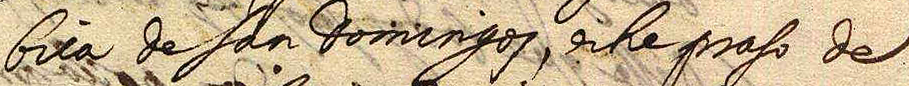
bica de san Domingos, E he praso de
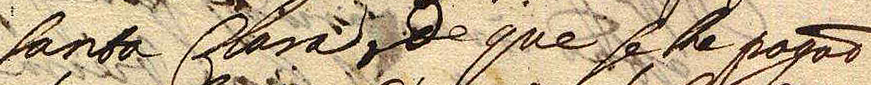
santa Clara, de que se lhe pagão
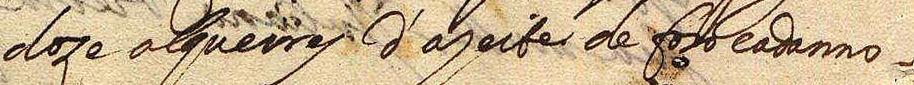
doze alqueires d'azeite de foro cadanno
